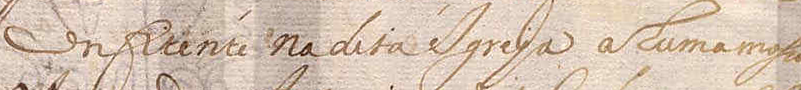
confitente na dita Igreja a huma mossa
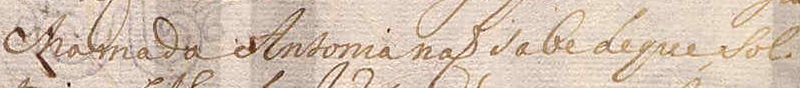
chamada Antonia naõ sabe de que, sol
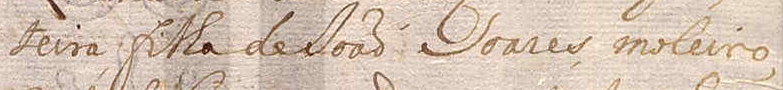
teira, filha de Ioaõ Soares, moleiro,
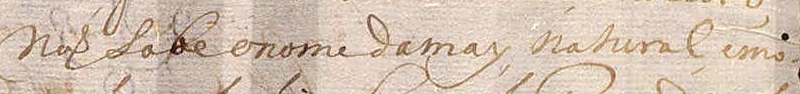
naõ sabe o nome da may, natural, e mo
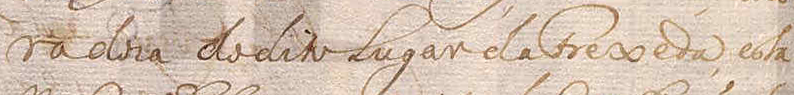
radora do dito Lugar da Frexeda, esta
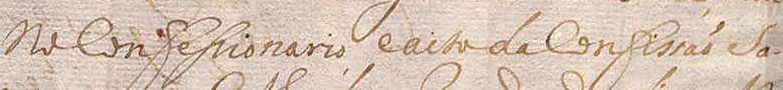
no Confessionario, e acto da Confissaõ Sa
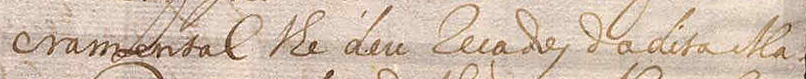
cramental lhe deu Recados da dita Ma
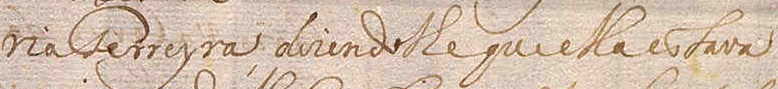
ria Ferreyra, dizendolhe que ella estava
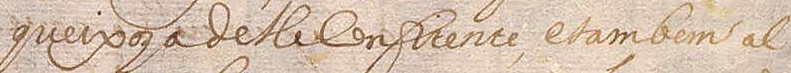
queixoza delle Confitente, e tambem al
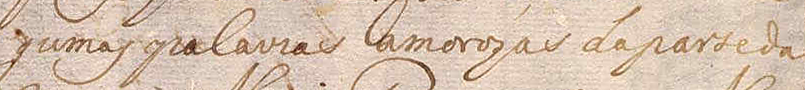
gumas palavras amorozas da parte da
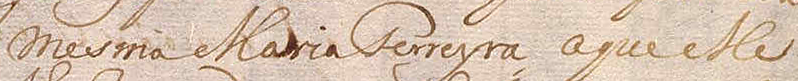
mesma Maria Ferreyra, a que elle
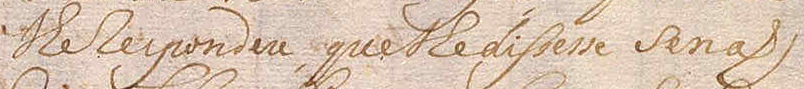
lhe Respondeu, que lhe dissesse se naõ
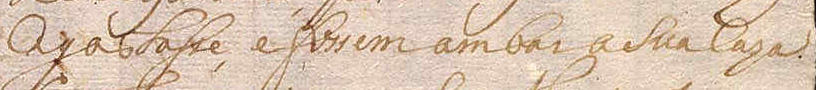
A gastasse, e fossem ambas a sua caza
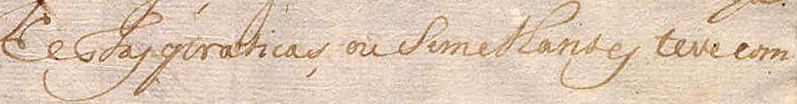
E estas praticas, ou Semelhantes teve com
